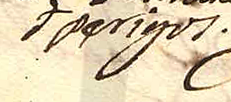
d̄ perigos.
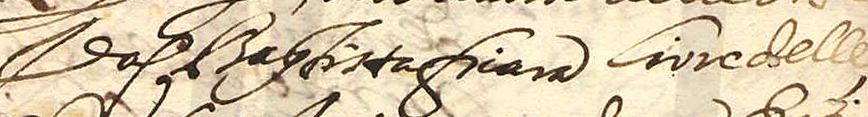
Joaõ Baptista ficara Livre delle,
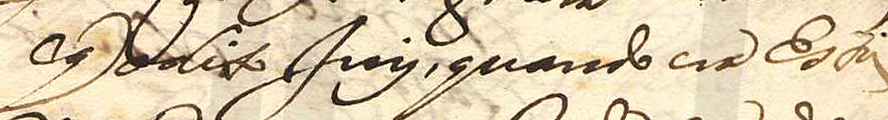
e q̄ o dito Juis, quando era Estu
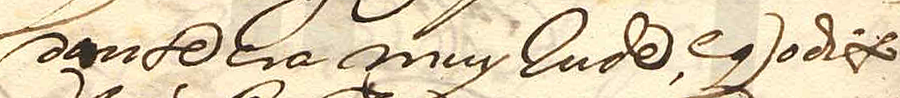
dante era muy Rude, e q̄ o dito
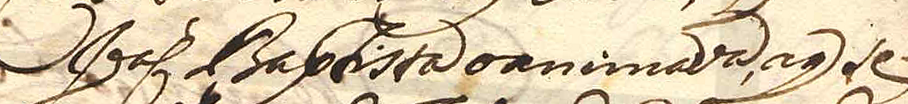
Joaõ Baptista o animava, a q̄ se
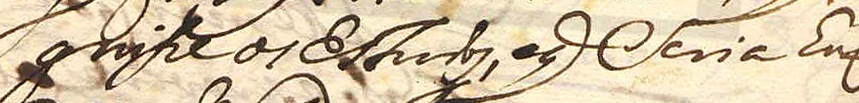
guisse os Estudos, e q̄ Seria hū
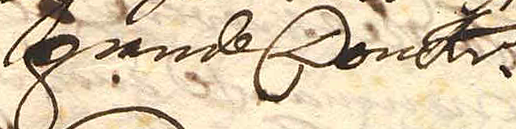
grande Doutor.
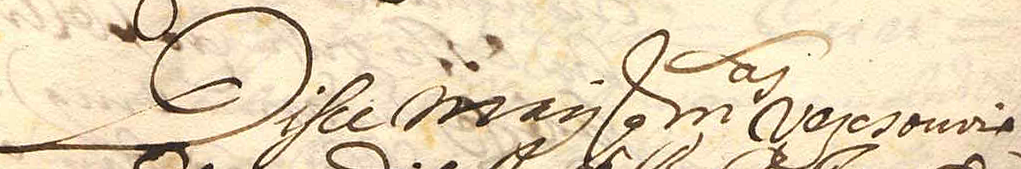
Disse mais q̄ mtas vezes ouvia
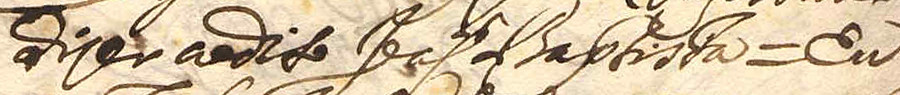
dizer ao dito Joaõ Baptista = Eu
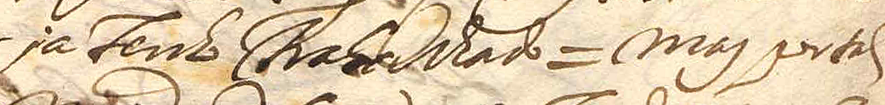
ja tenho traballhado = mas por tal
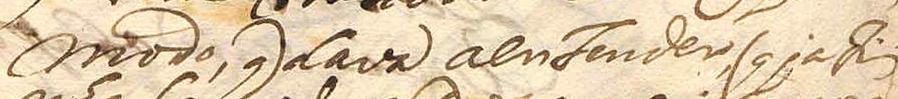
modo, q̄ dava a entender q̄ ja ti
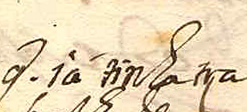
q̄. iá tinha tra
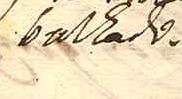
balhado.
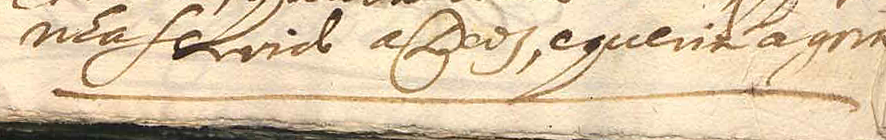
nha servido a Deos, e queria agora
